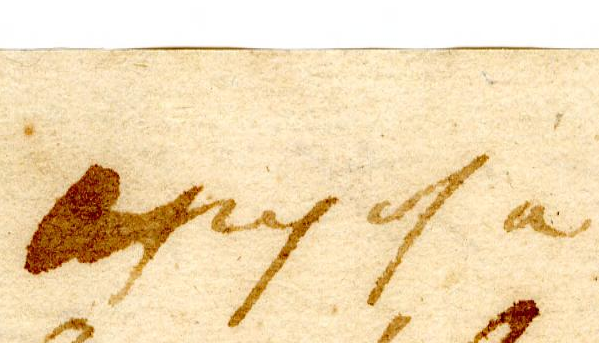Copy of a
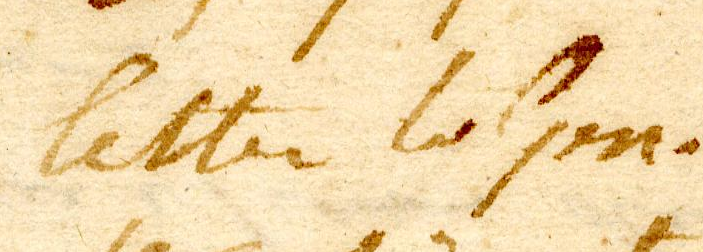letter to Gen
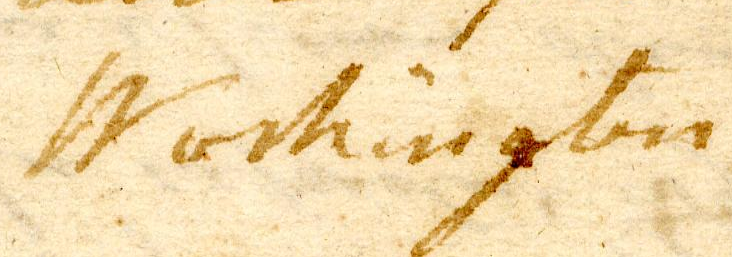Washington
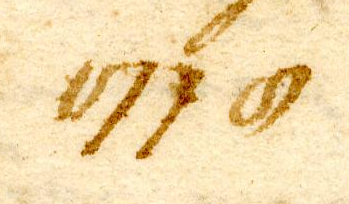1778
